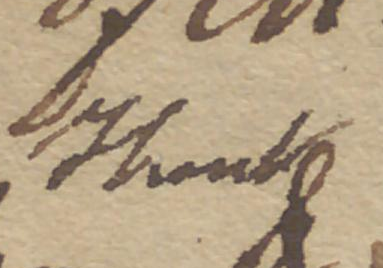Hunt
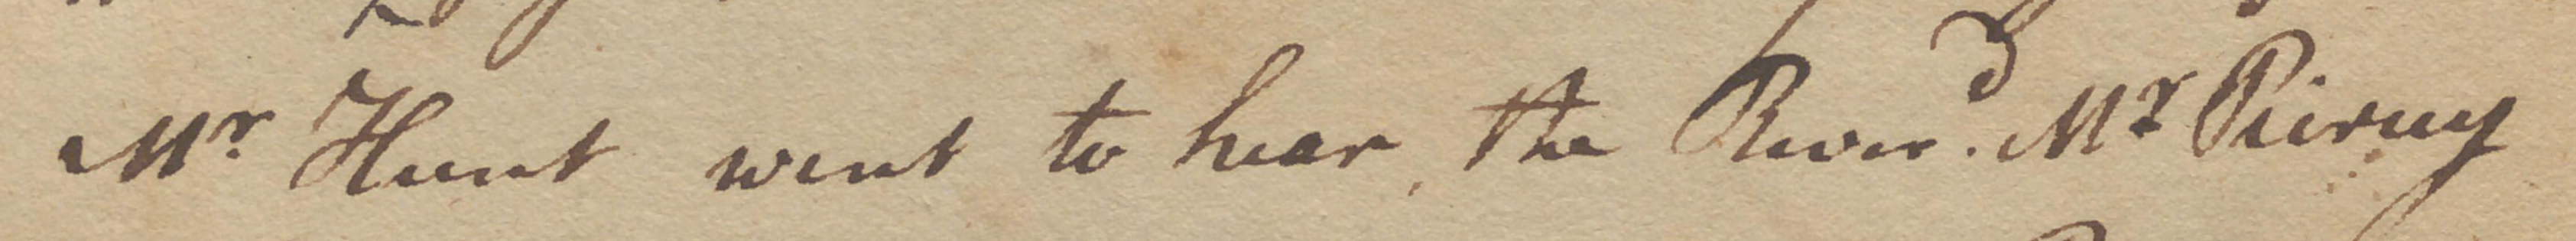M^r. Hunt went to hear the Rever^d. M^r Piercey
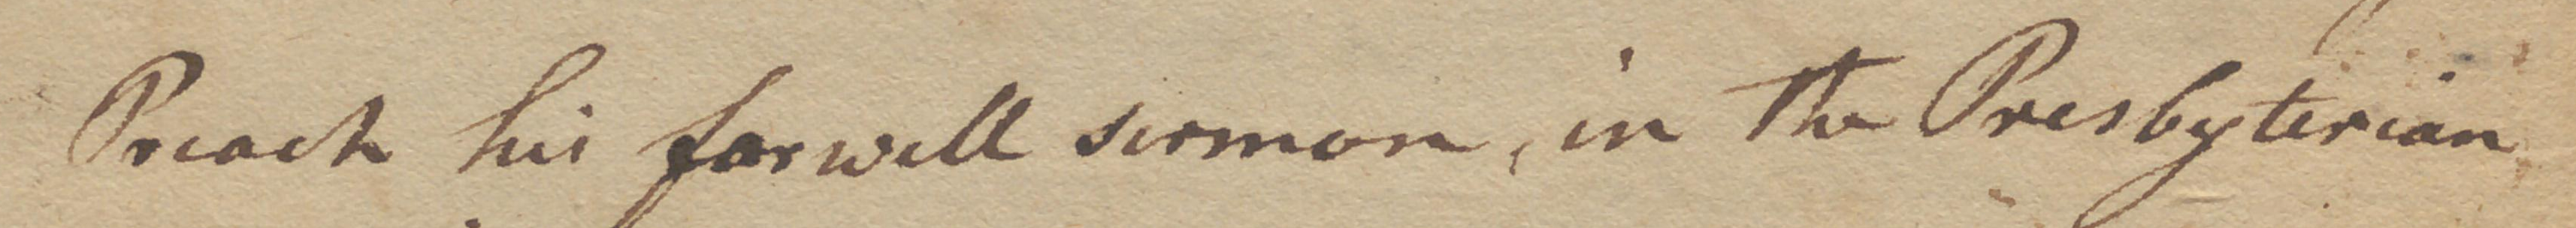Preach his farwell sermon, in the Presbyterian
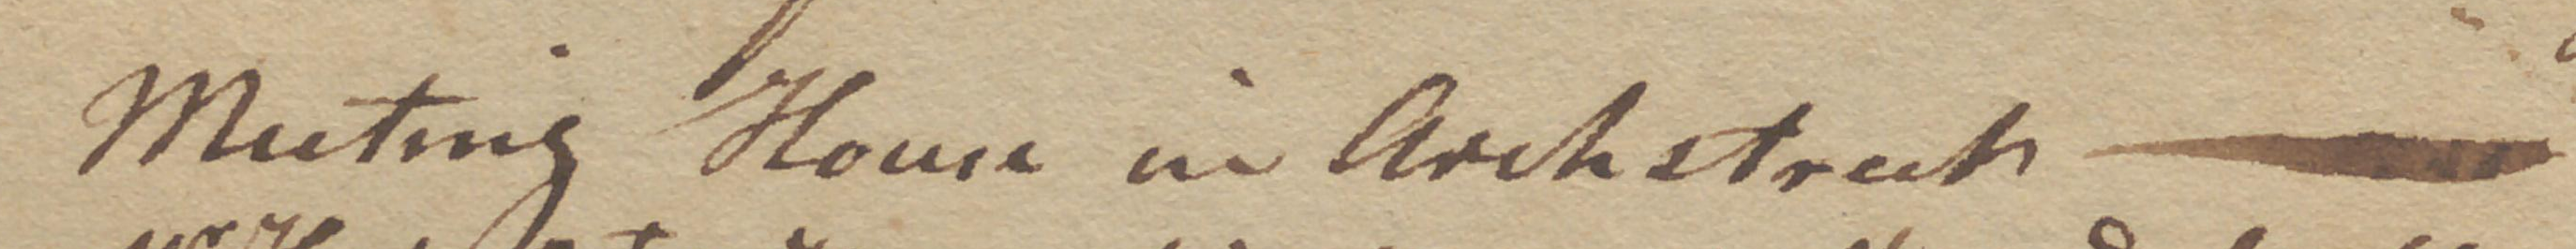Meeting House in Arch street-
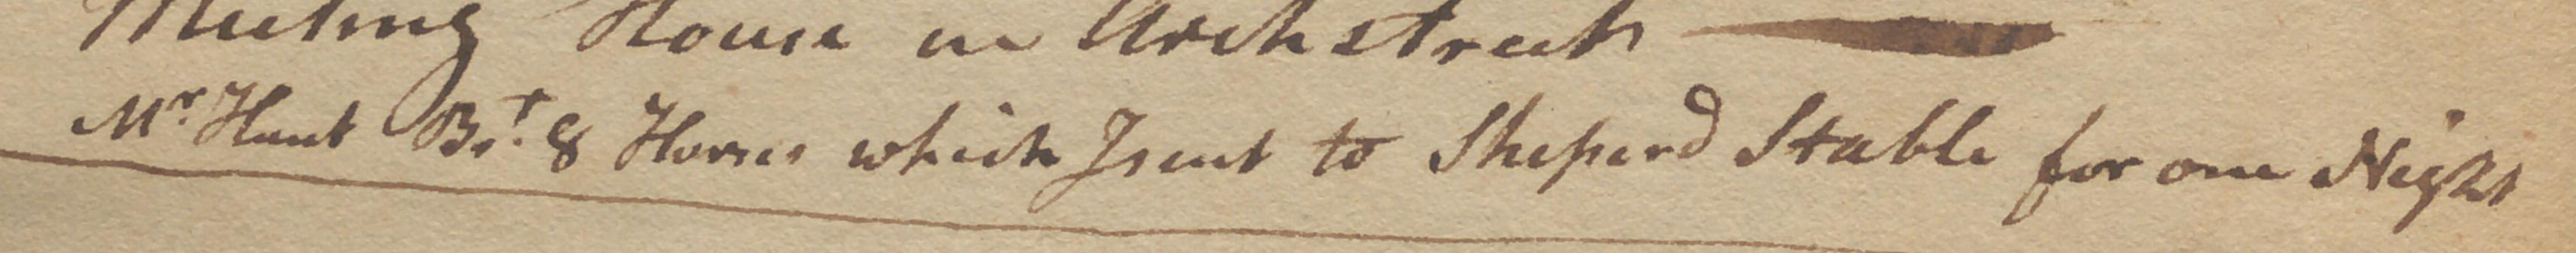M^r. Hunt Br^t. 8 Horses which I sent to Sheperd Stable for one Night
